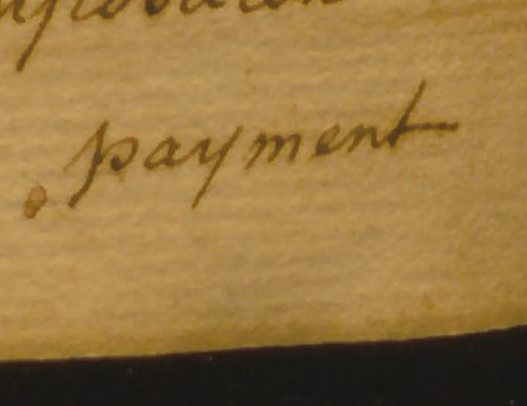payment
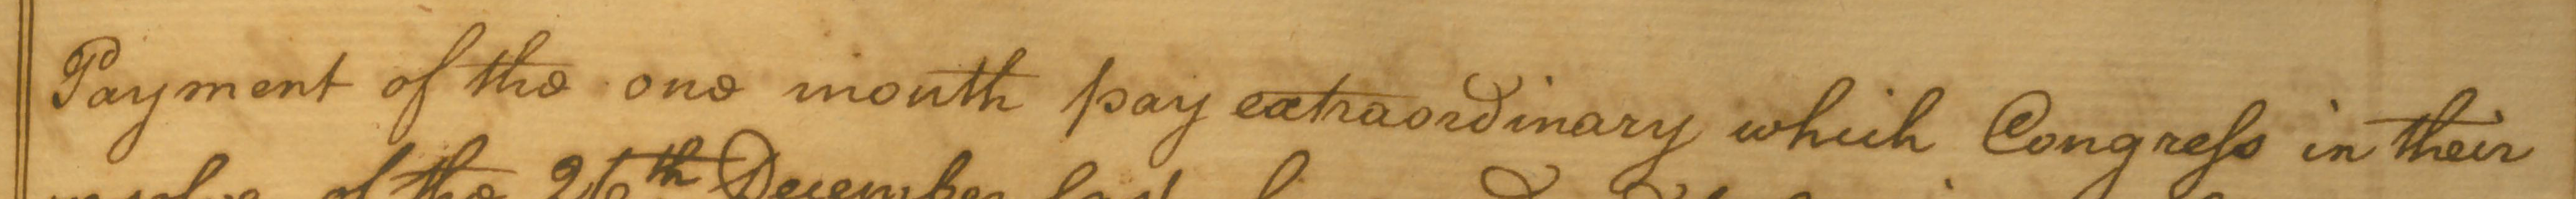Payment of the one month pay extraordinary which Congress in their
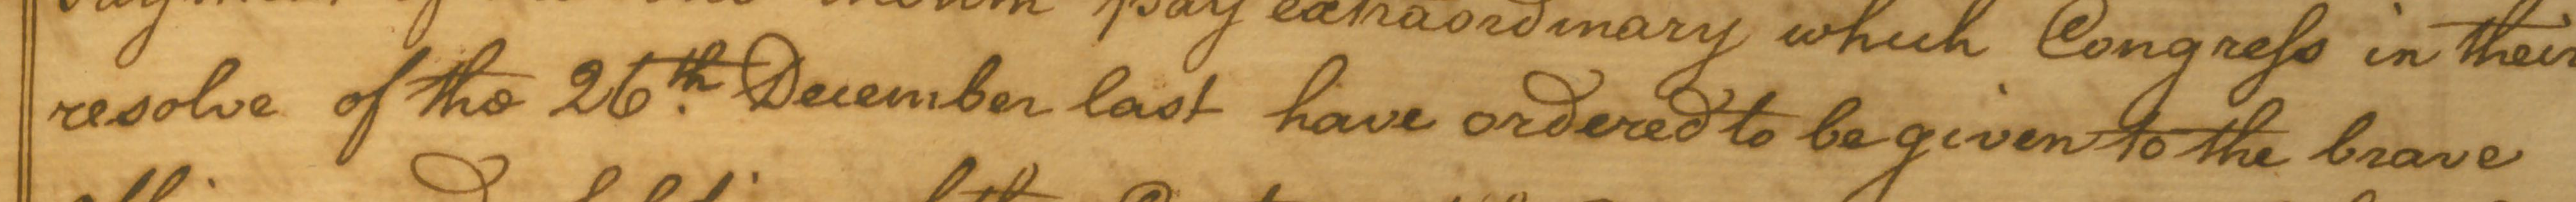resolve of the 26^th. December last have ordered to be given to the brave
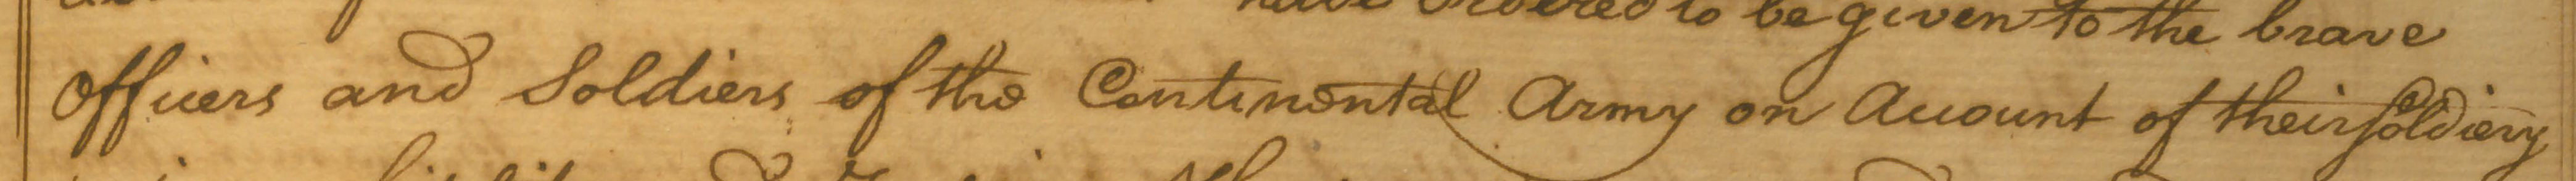Officers and Soldiers of the Continental Army on Account of their soldiery
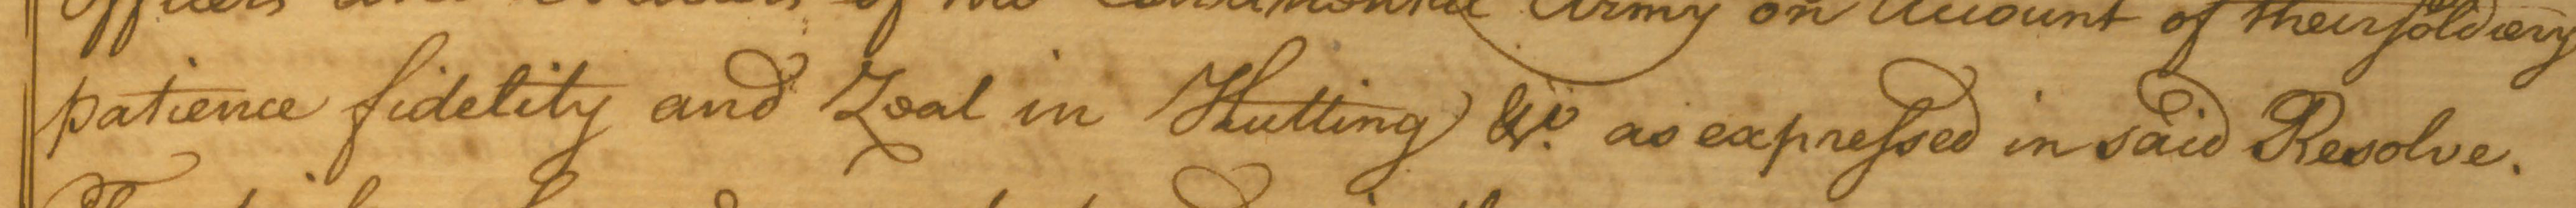patience fidelity and Zeal in Hutting &c. as expressed in said Resolve.
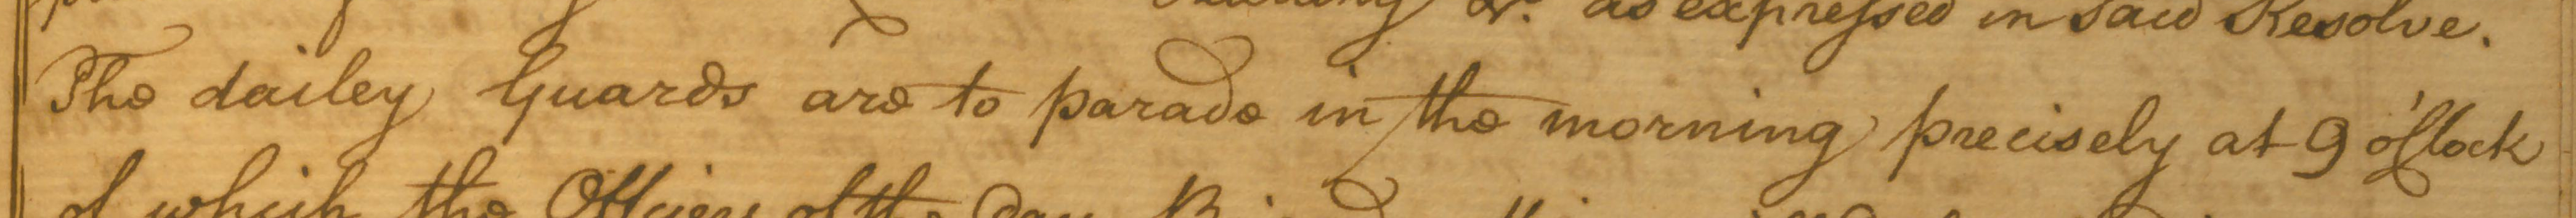The dailey Guards are to parade in the morning precisely at 9 o'Clock
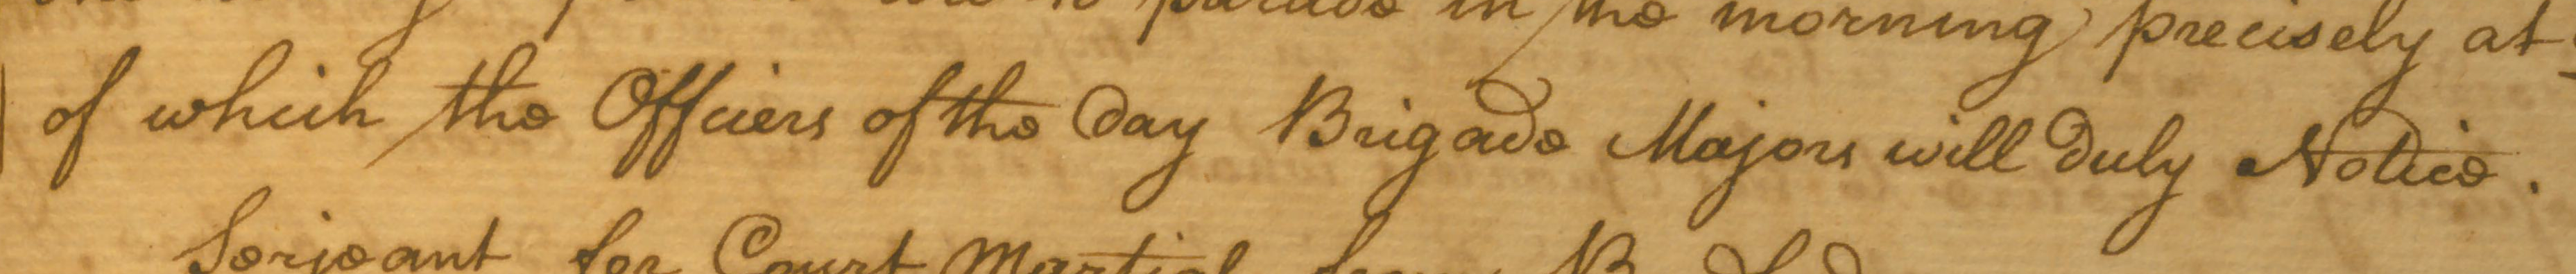of which the Officers of the day Brigade Majors will duly Notice.
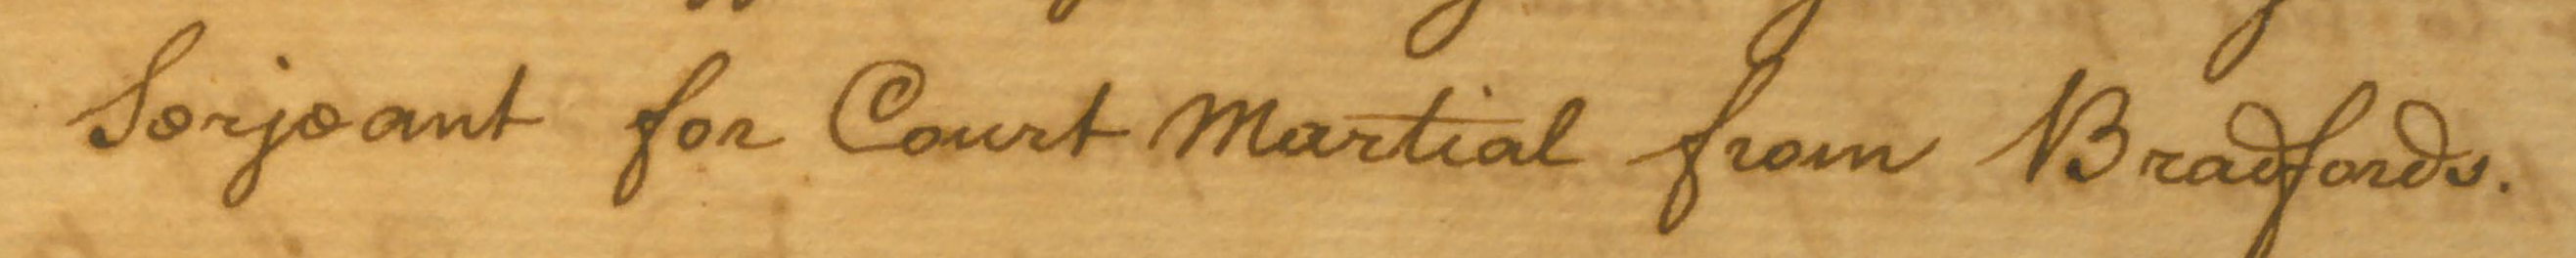Serjeant for Court Martial from Bradfords.
